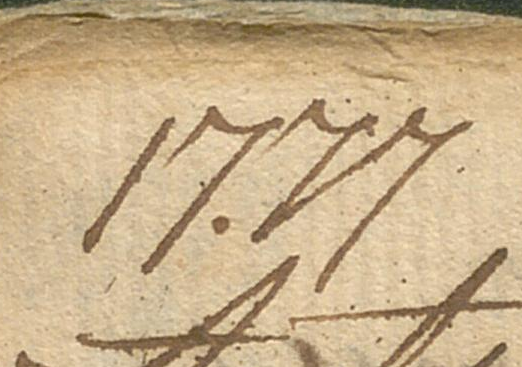1777
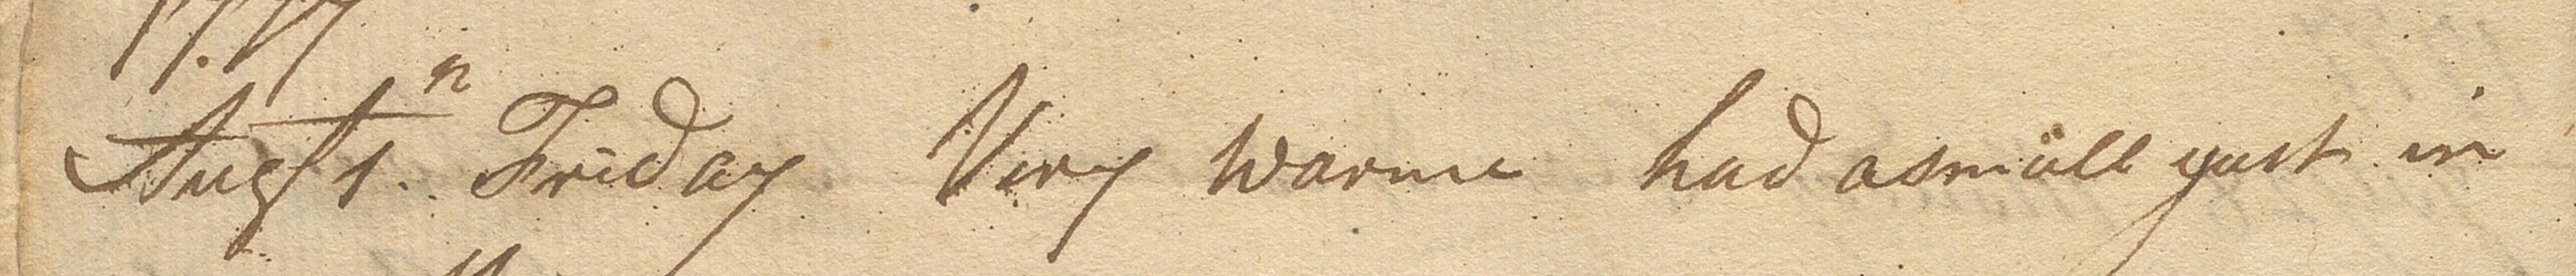Augt 1^th. Friday Very warme had a small gust in
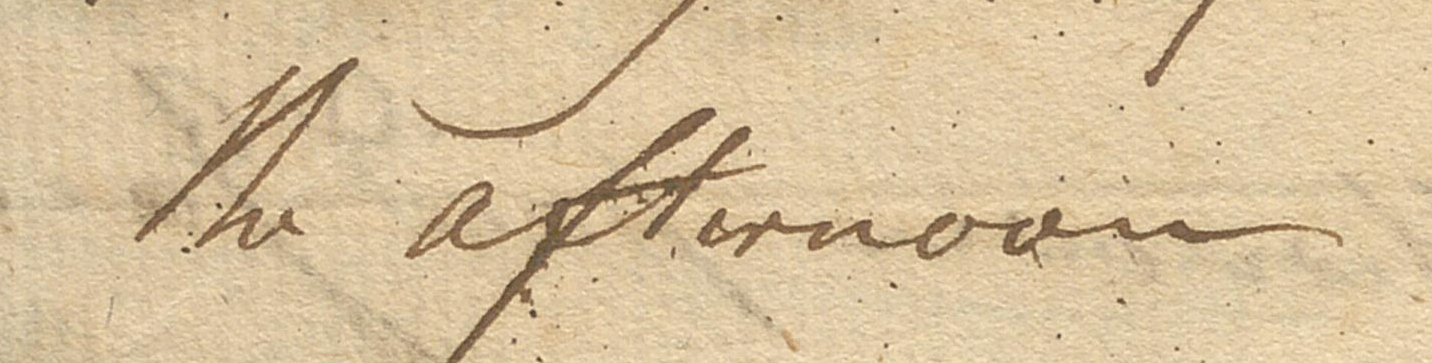the afternoon
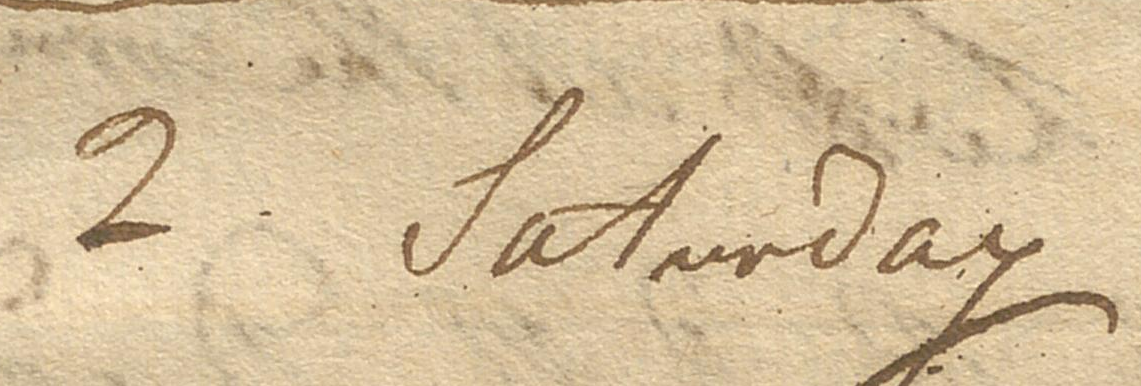2. Saturday
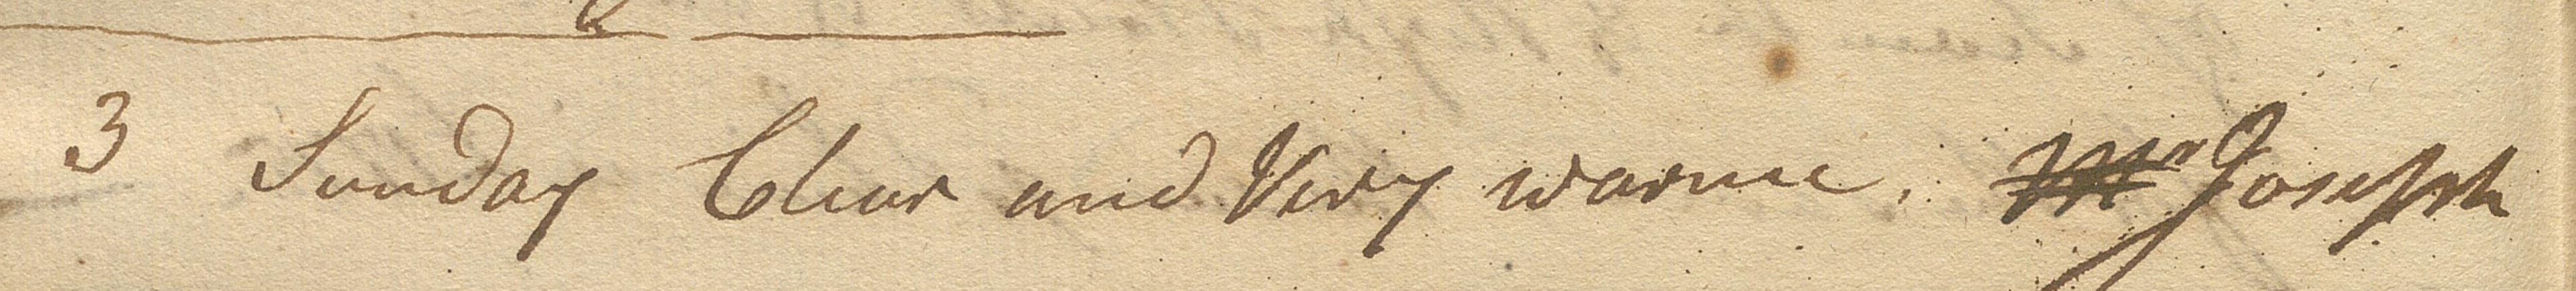3 Sunday Clear and Very warme. [M^r] Joseph
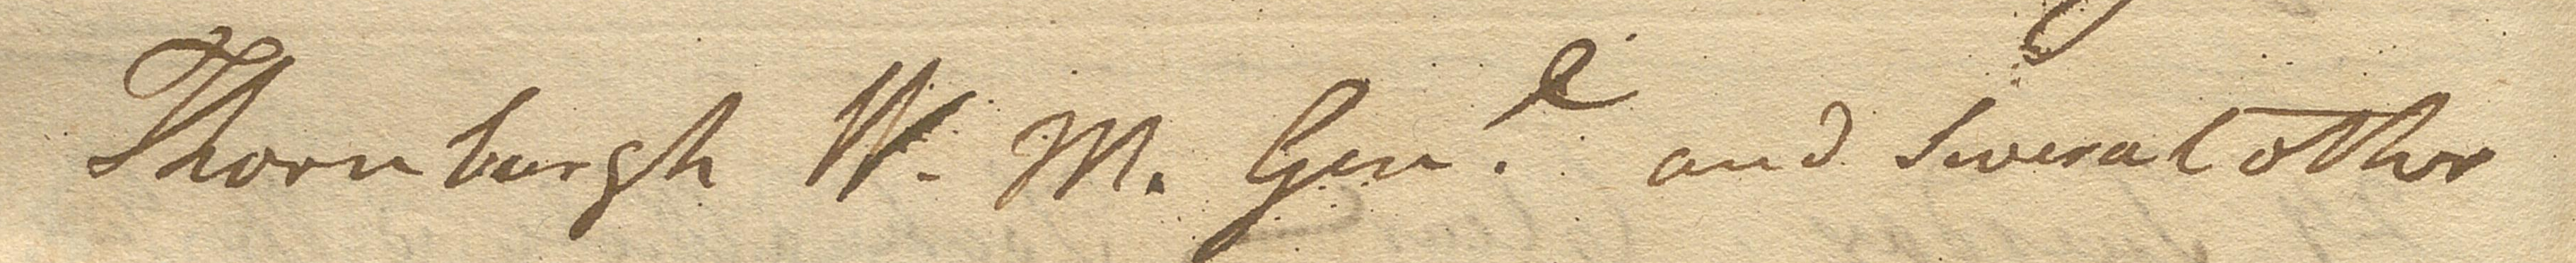Thornburgh W. M. Gen^l. and several other
